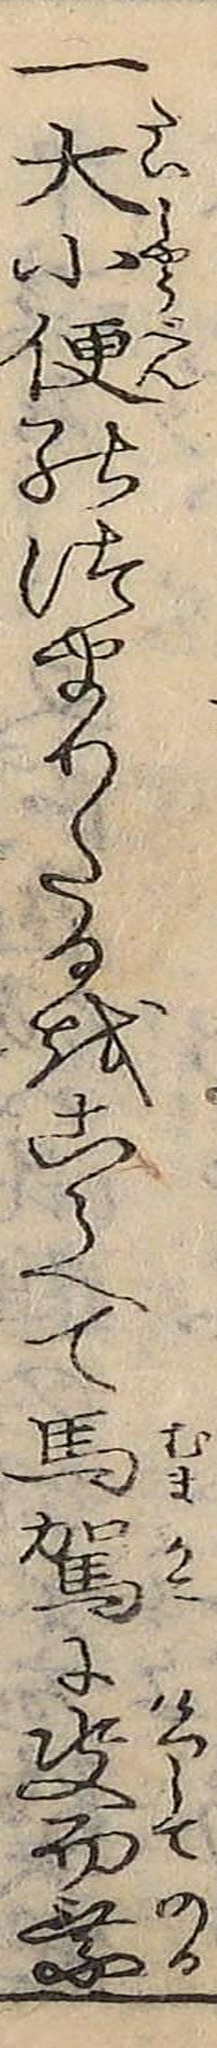一大小便のつまりたるをこらへて馬駕に決而乗
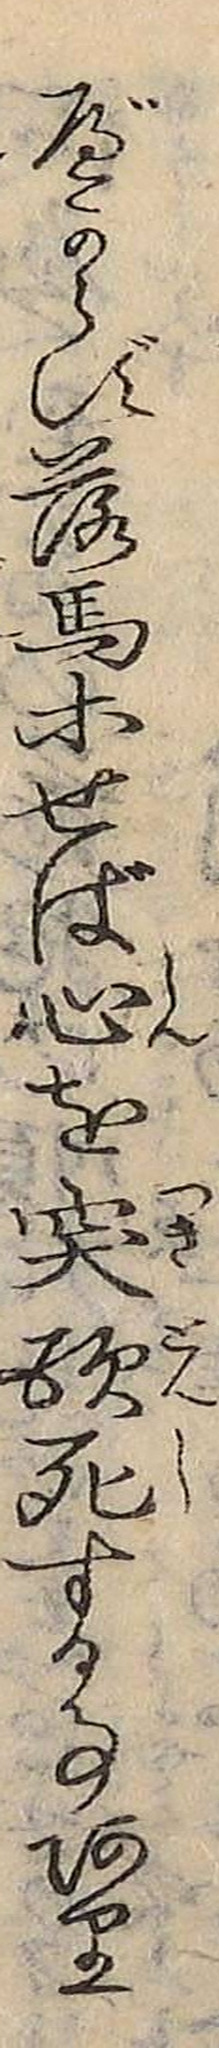べからず落馬等せば心を突頓死する事あり
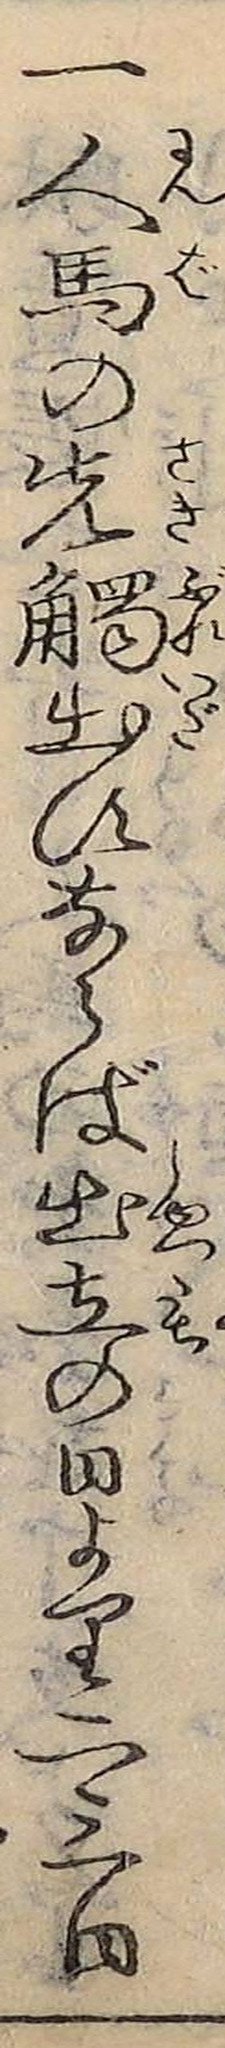一人馬の先触出すならば出立の日より二三日
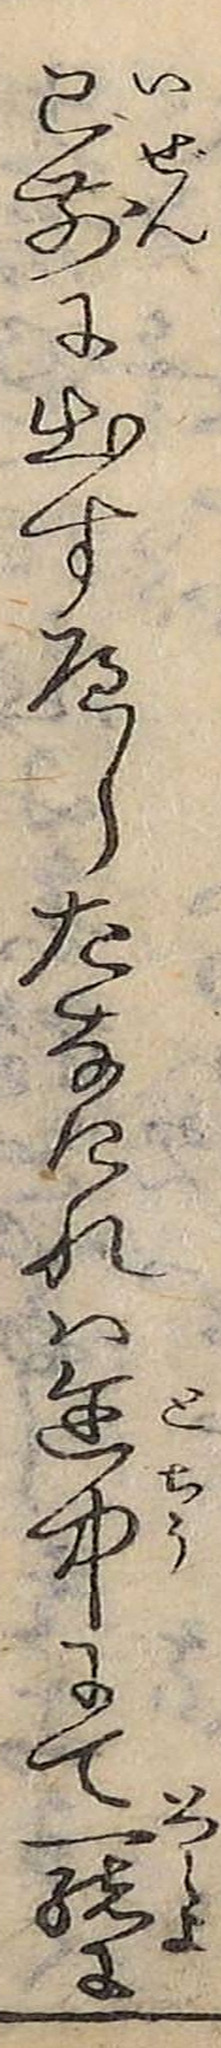已前に出すへし左なけれは途中にて一緒に
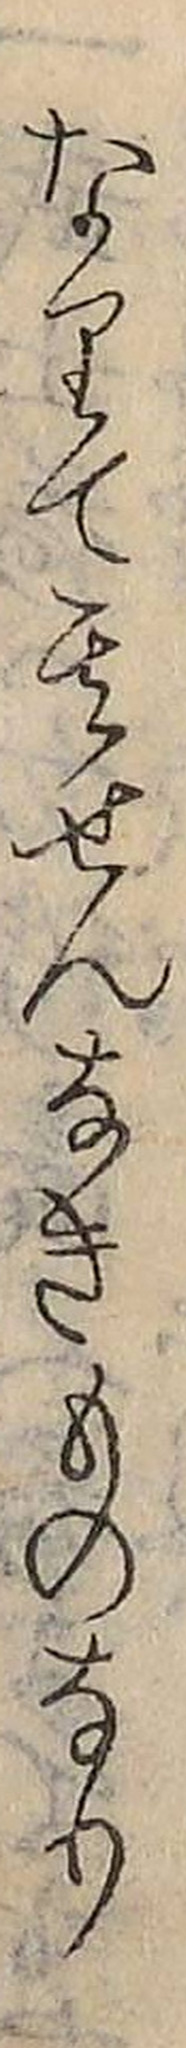なりて其せんなきものなり

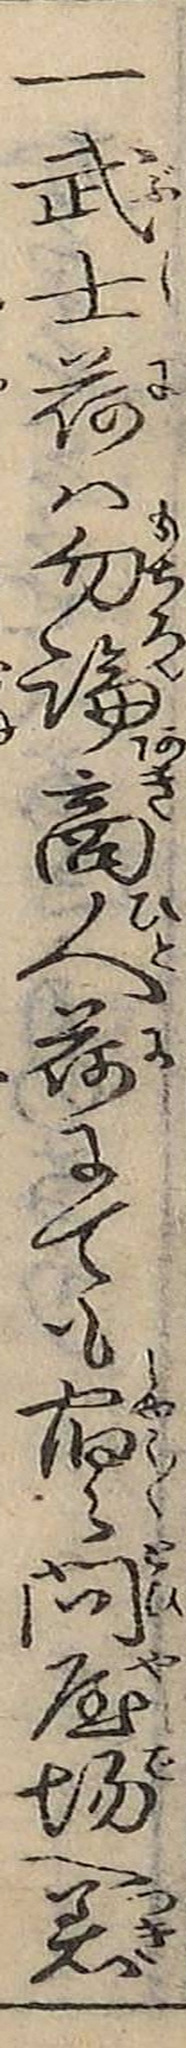一武士荷は勿論商人荷にても宿々問屋場へ着
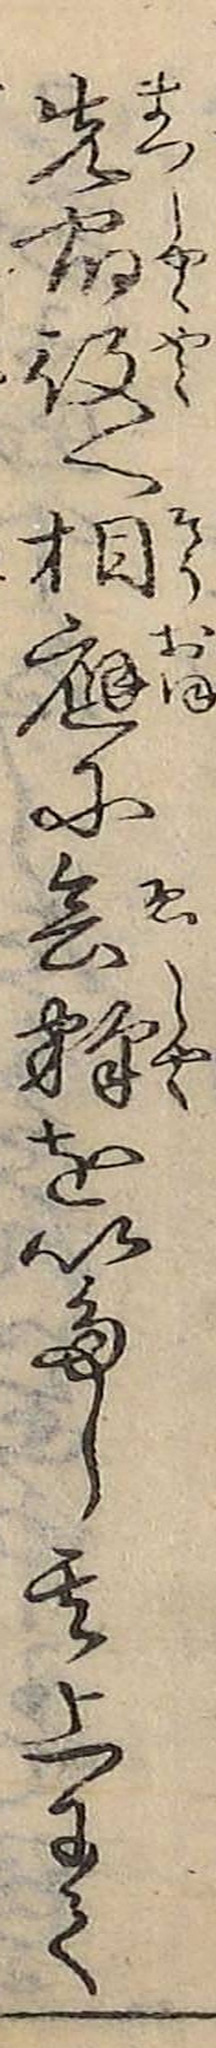先宿役へ相応に会釈をいたし其上にて
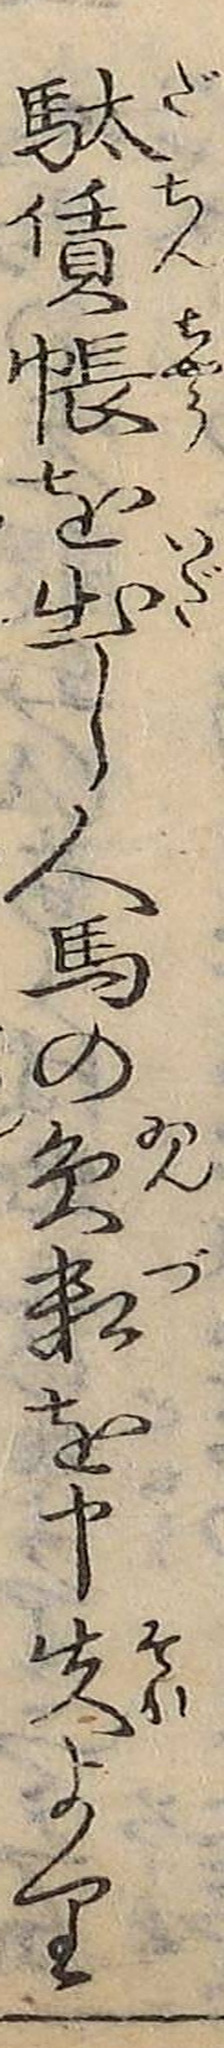駄賃帳を出し人馬の員数を申先より
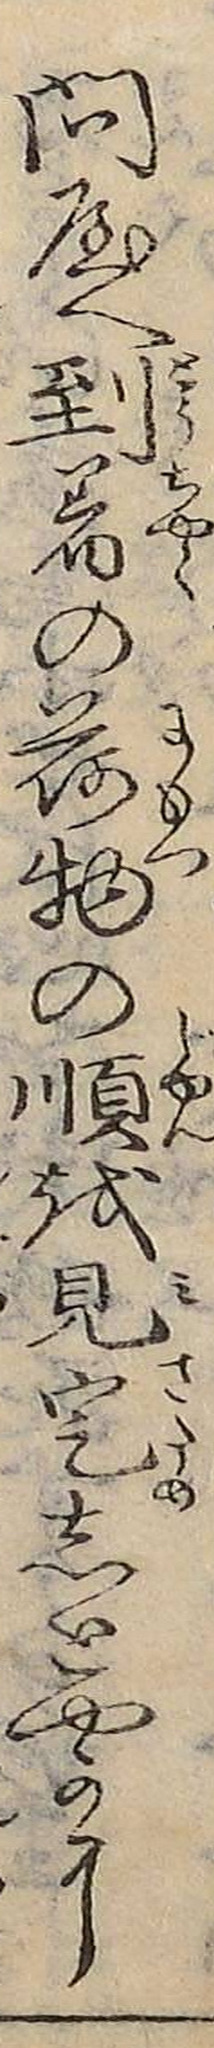問屋へ到着の荷物の順を見定しとやかに
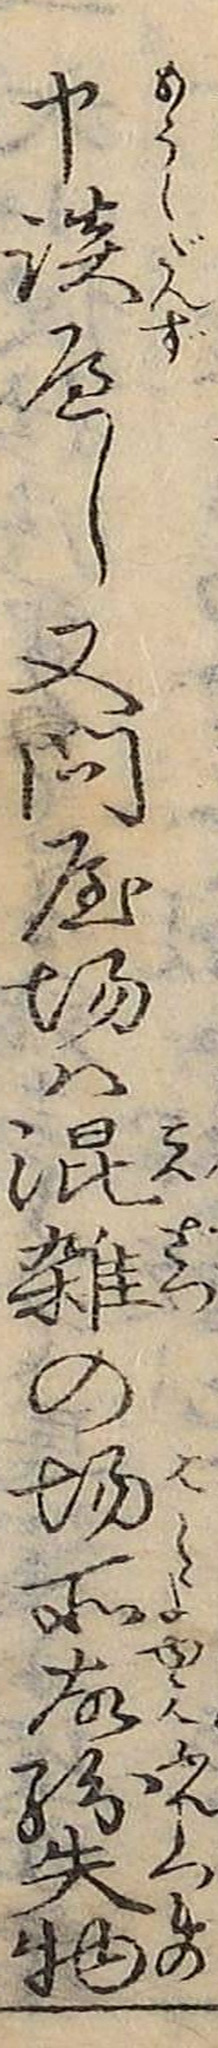申談へし又問屋場は混雑の場所故紛失物
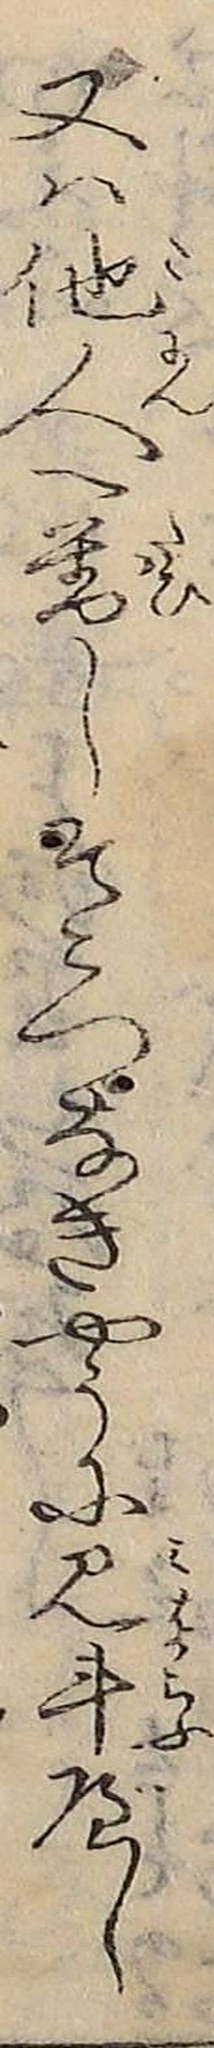又は他人へ対しそこつなきやうに見計べし
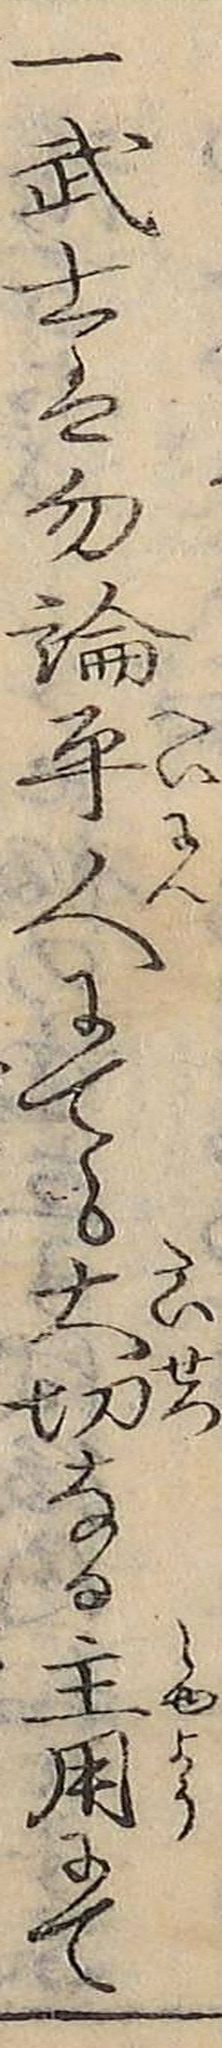一武士は勿論平人にても大切なる主用にて
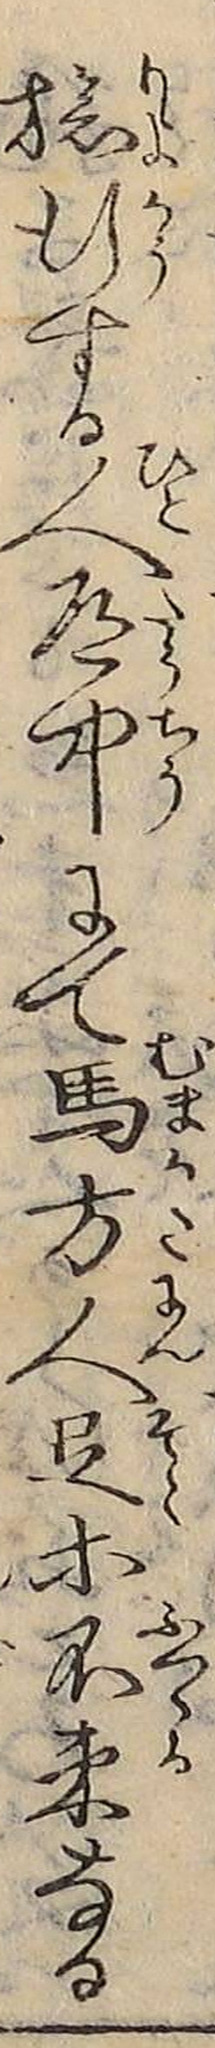旅行する人道中にて馬方人足等不束なる
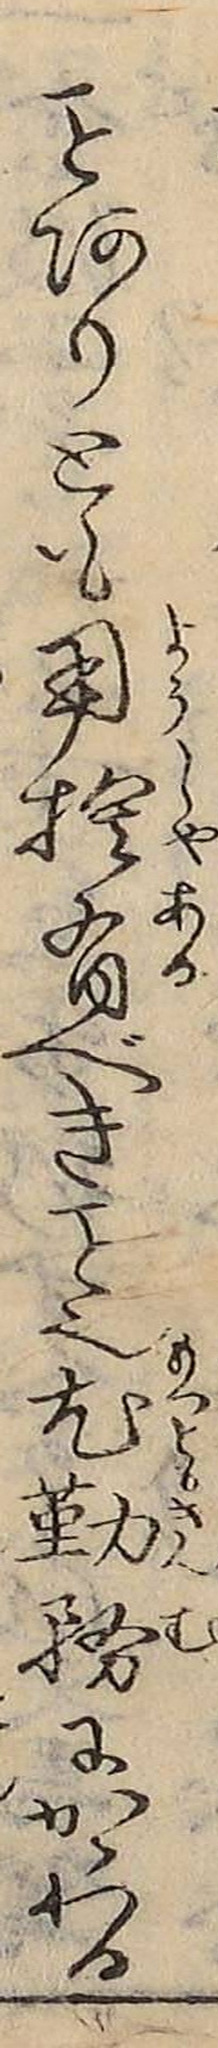ことありとも用捨有べきこと也尤勤務にかゝわる
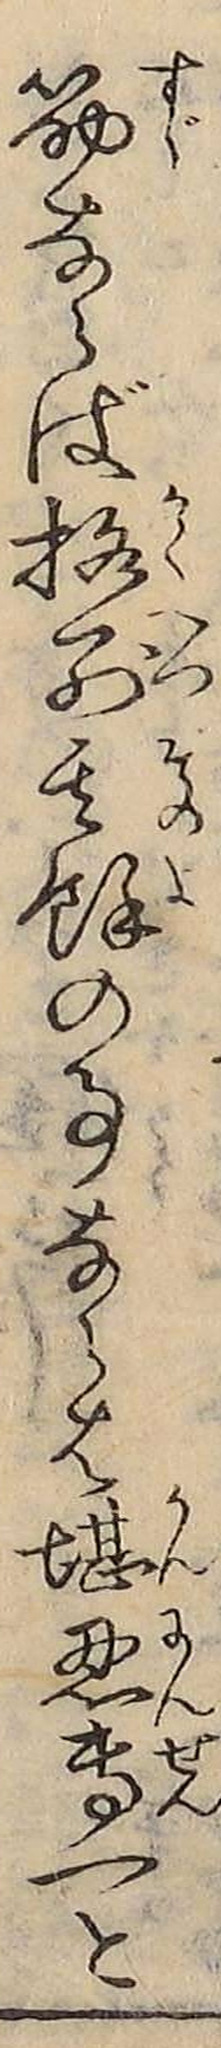筋ならば格別其余の事ならは堪忍専一と
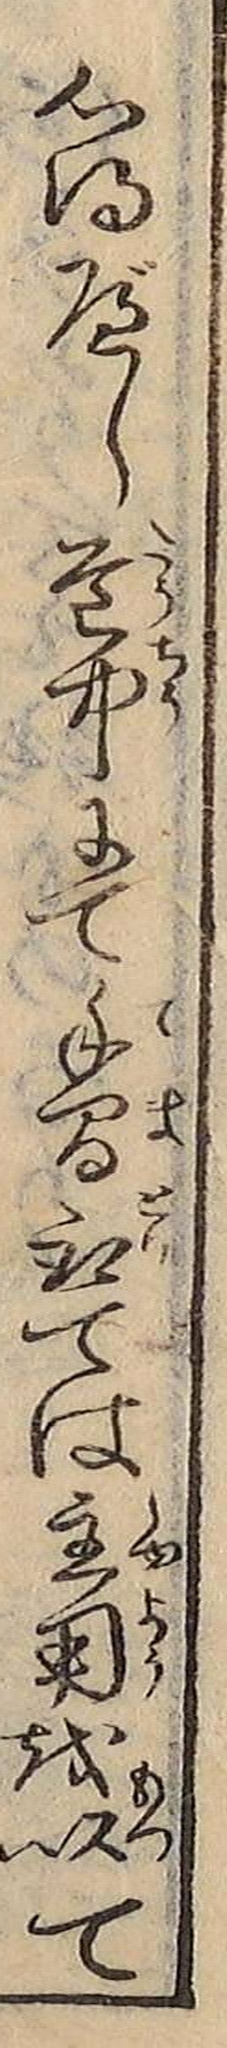心得べし道中にて手間取ては主用を以て
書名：旅行用心集
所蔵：神戸大学附属図書館 国文学研究資料館
